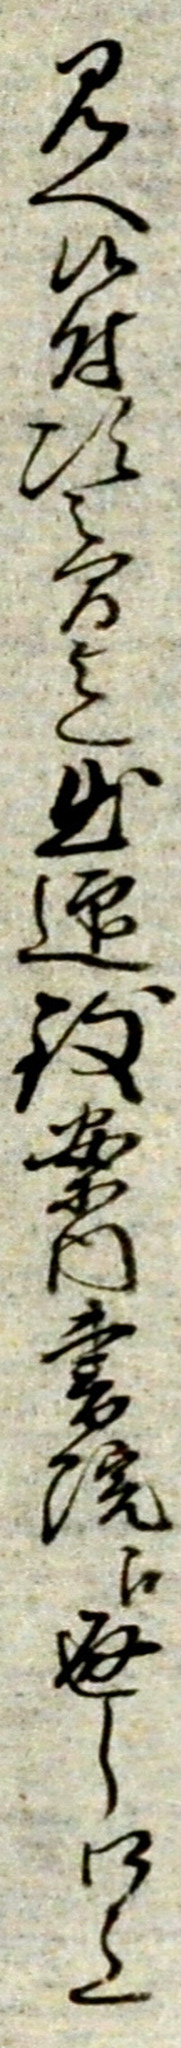見へ候付次之間迄出迎致案内書院江通し口上
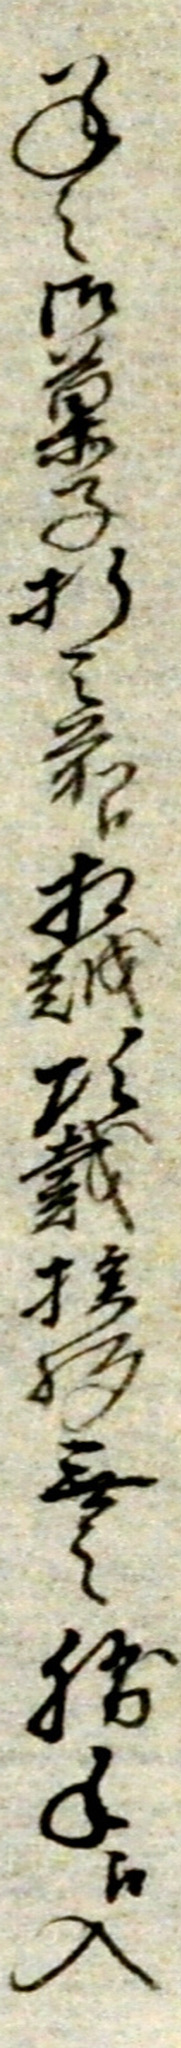承之御菓子折之前江相越頂戴挨拶無之勝手江入
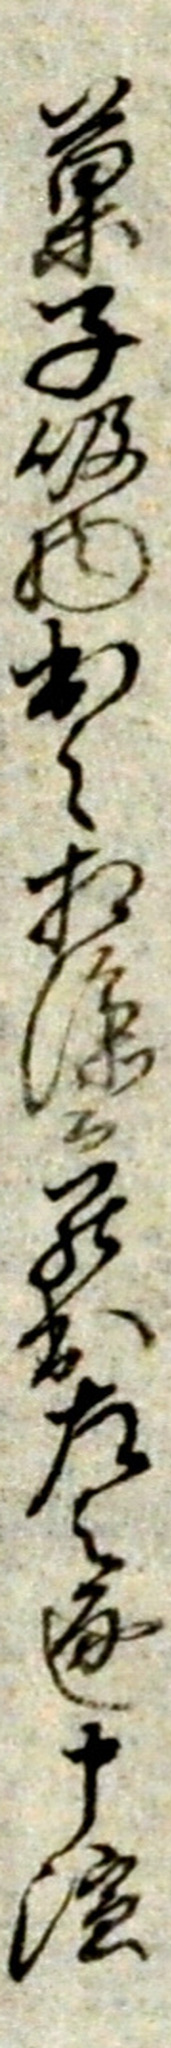菓子吸物出之相済而罷出左之通申演
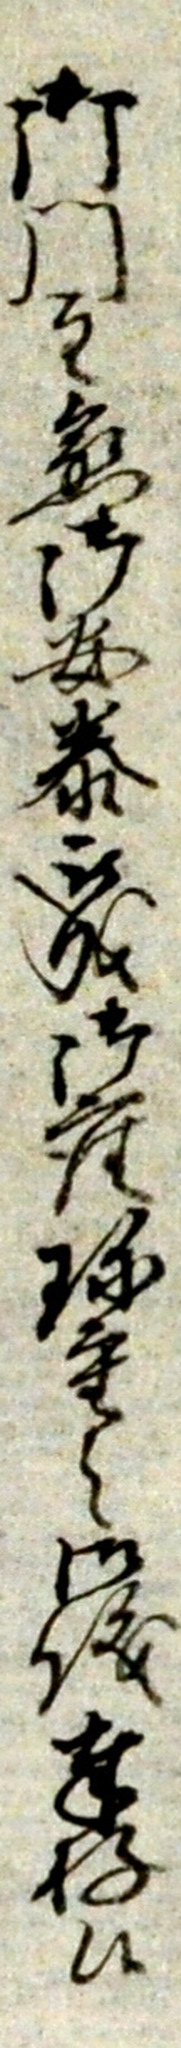御門主愈御安泰被成御座珍重之御儀奉存候
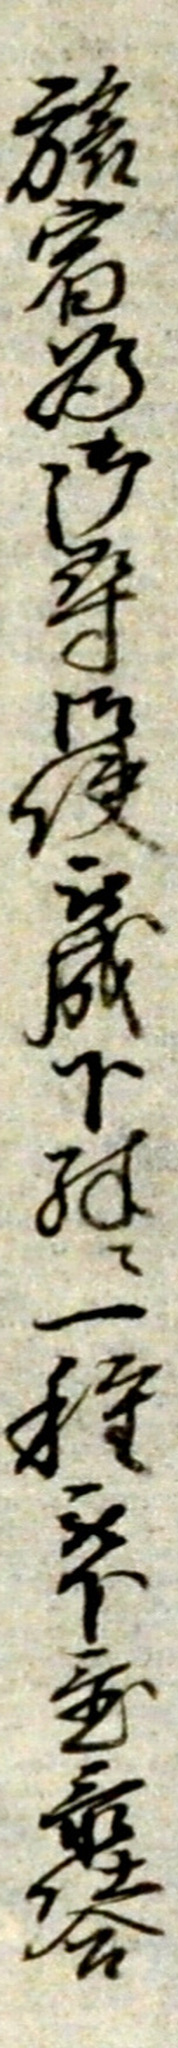旅宿為御尋御使被成下殊ニ一種被下置忝仕合
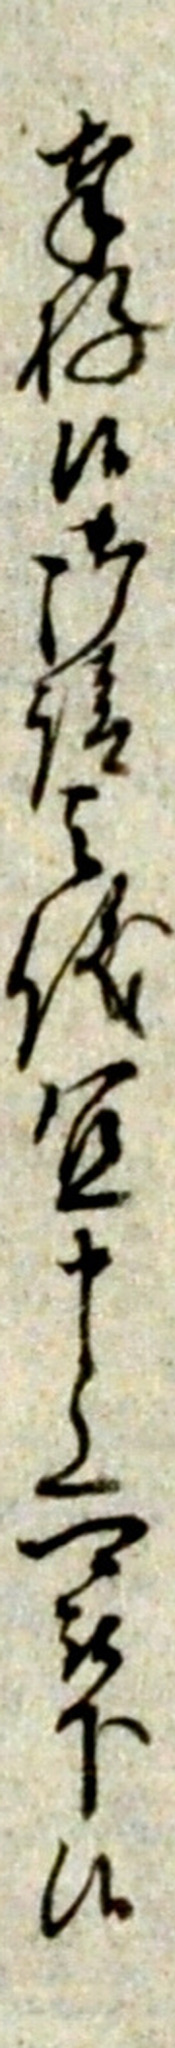奉存候御請之儀宜申上可被下候
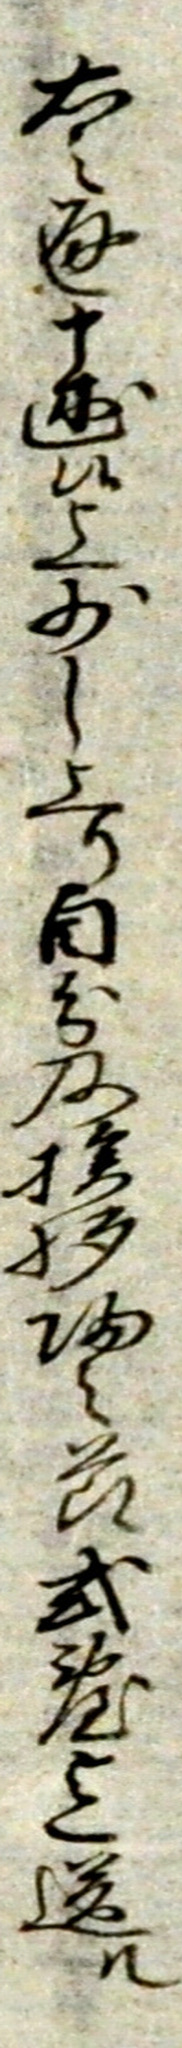右之通申述候上少し上り自分及挨拶帰之節式台迄送ル
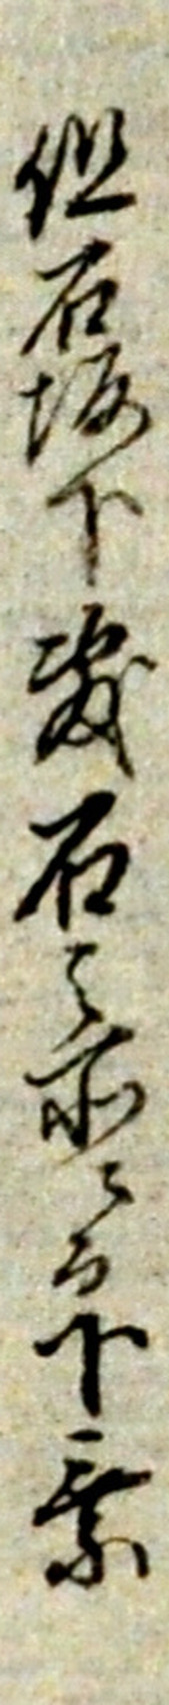但石坂下敷石之所ニ而下乗
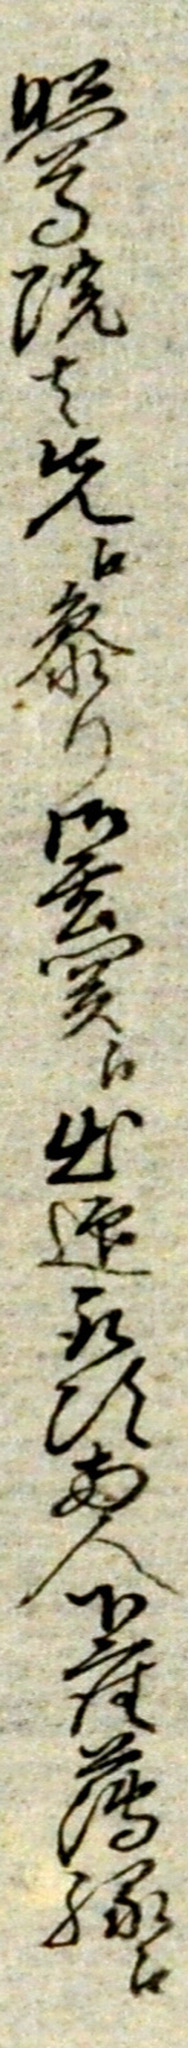照尊院者先江参り御玄関江出迎取次両人下座薄縁江
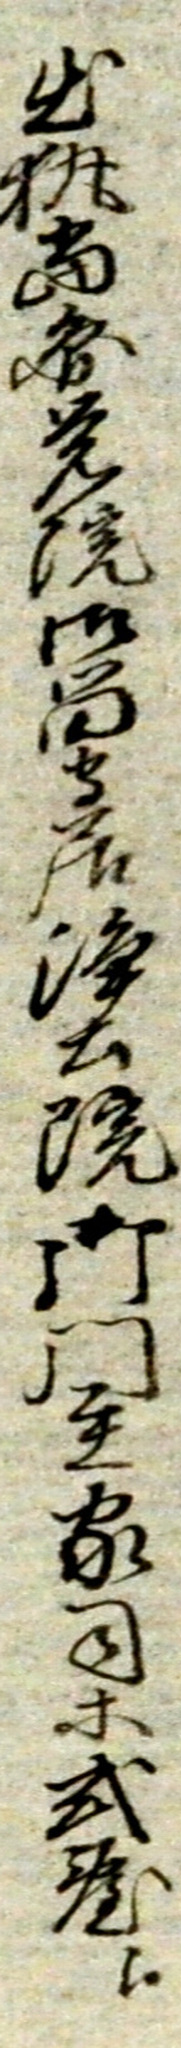出執当円覚院御留守居浄土院御門主家司等式台江
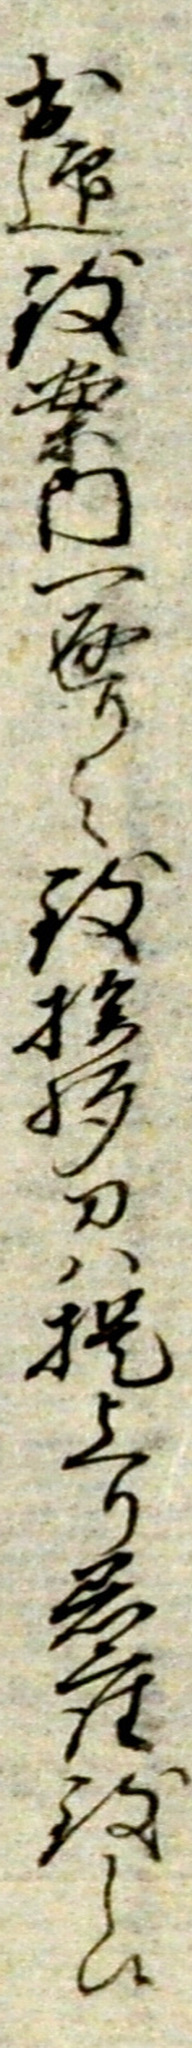出迎致案内一通り之致挨拶刀ハ提上り着座致し候
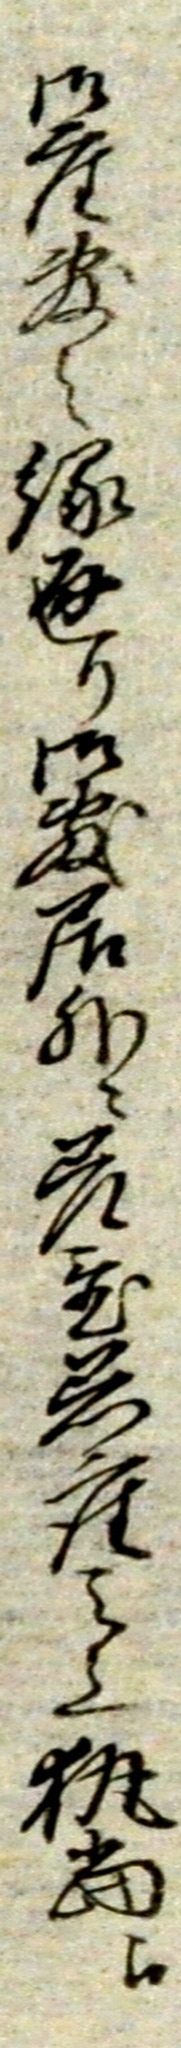御座敷之縁通り御敷居外ニ差置着座之上執当江
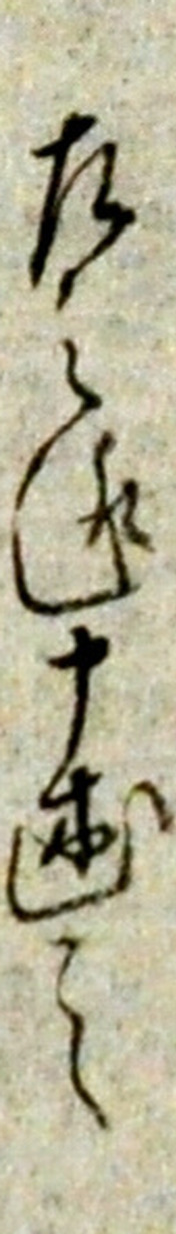左之趣申述之
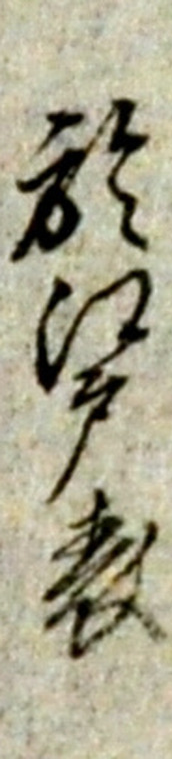於江戸表
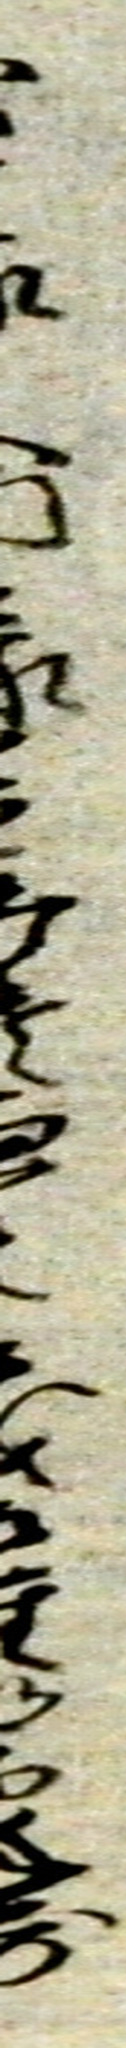公方様大納言様益御機嫌克被成御座候旨手前

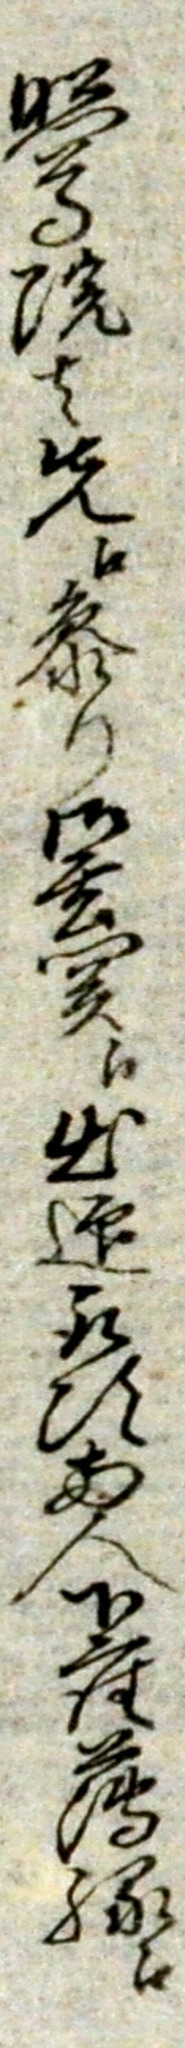照尊院を先江参り御玄関江出迎取次両人下座薄縁江
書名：日光御名代相勤候節ノ留
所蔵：伊那市立高遠町図書館・合同会社AMANE
